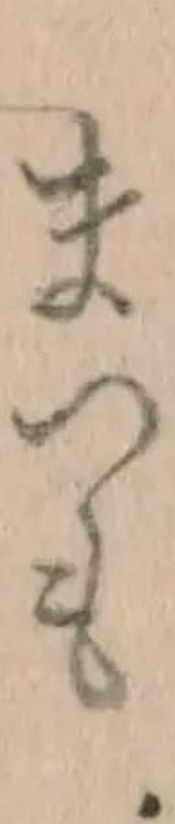まつも

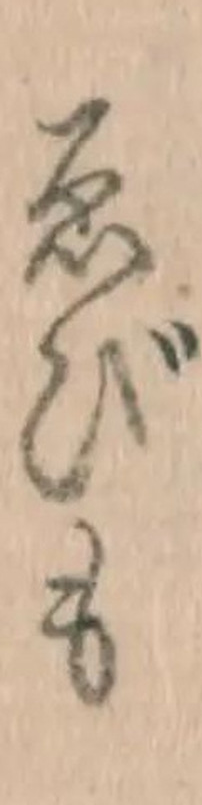ゑびも
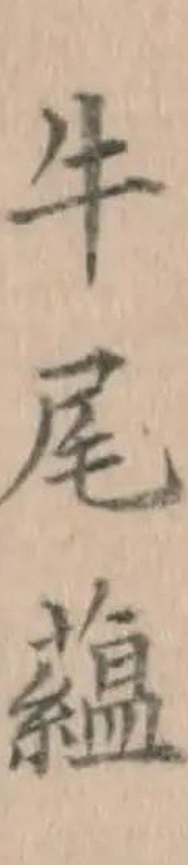牛尾蘊

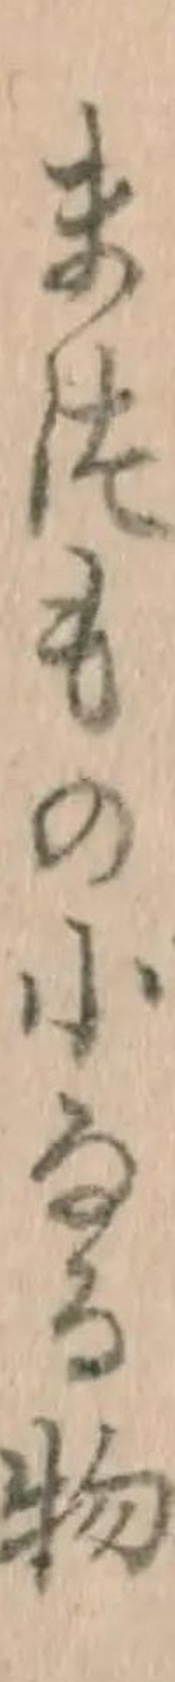まつもの小なる物
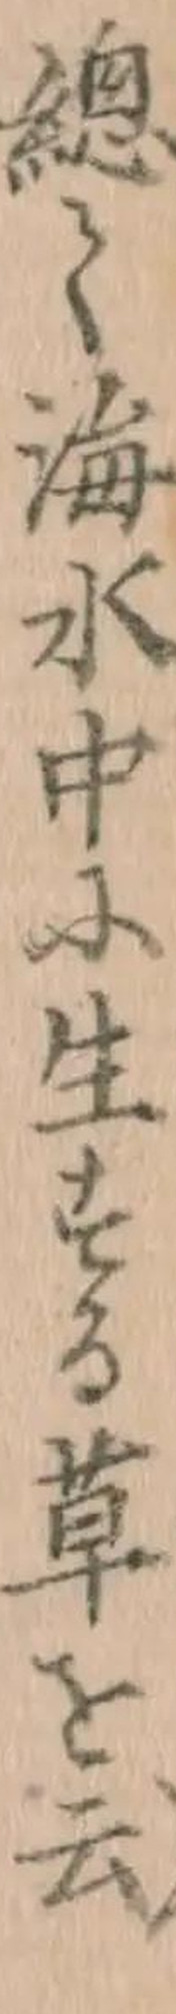海藻総て海水中に生する草を云
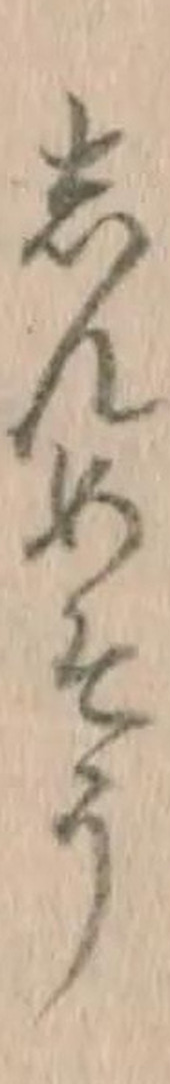しんめそう
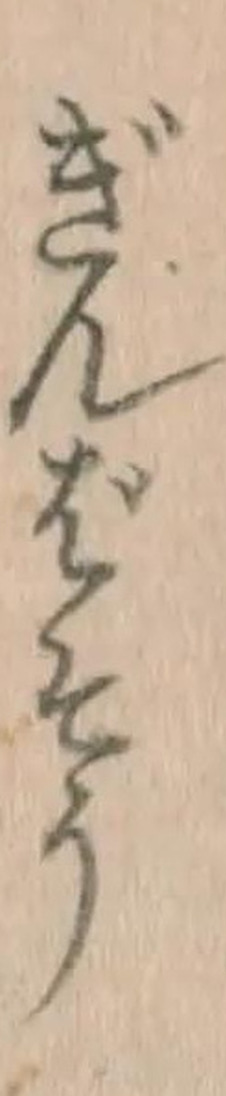ぎんばそう
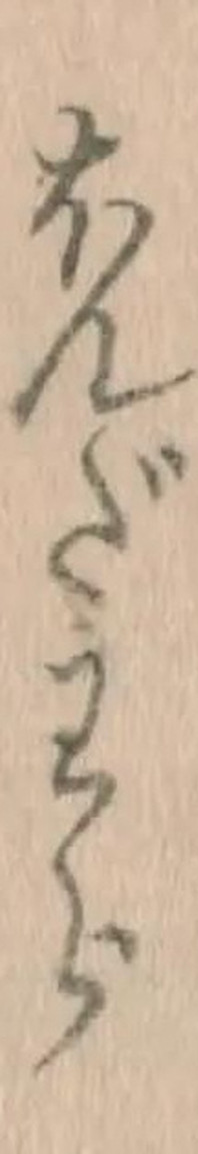ほんだわら
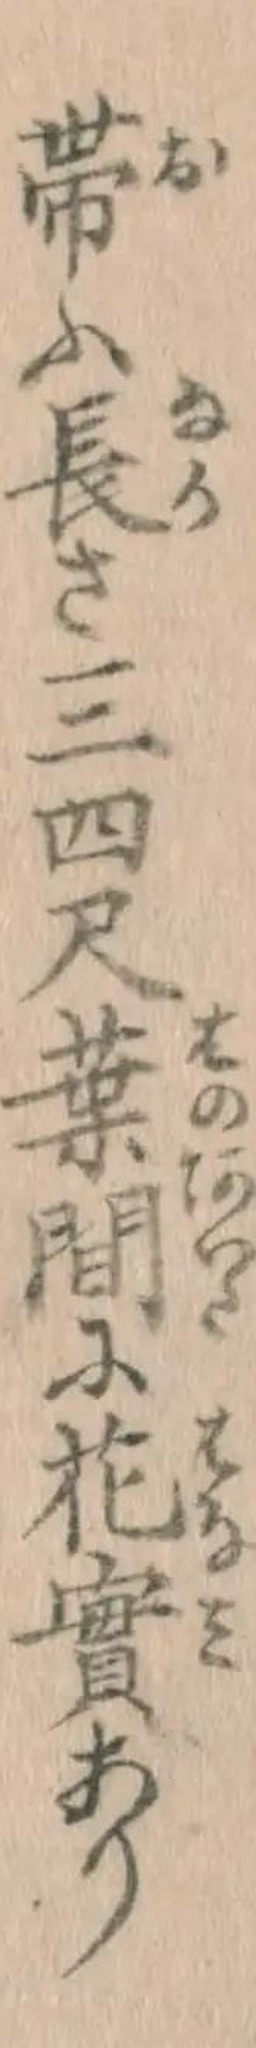帯ふ長さ三四尺葉間に花実あり

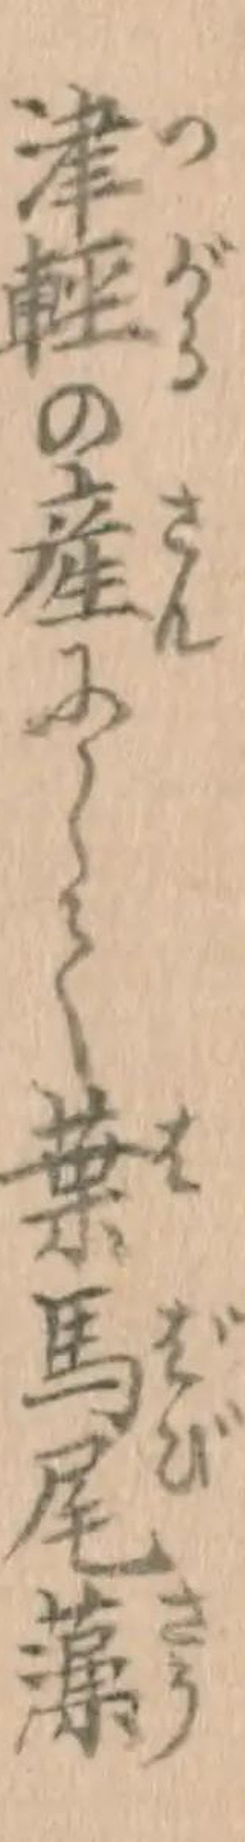津軽の産にして葉馬尾藻
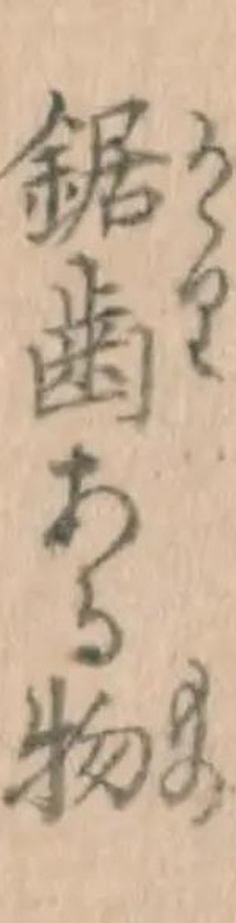鋸歯ある物
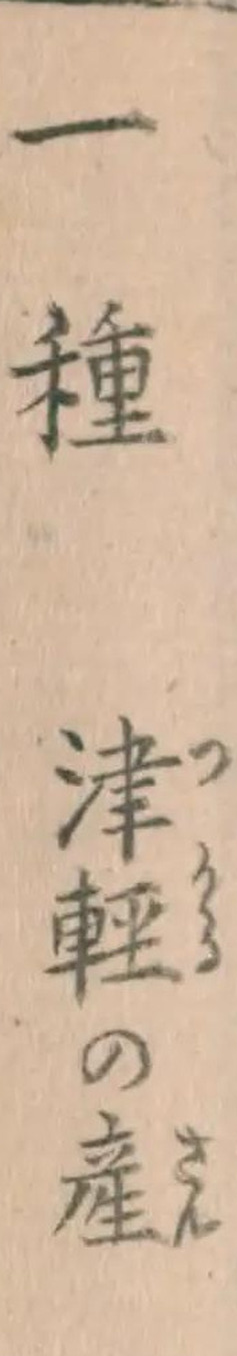一種津軽の産
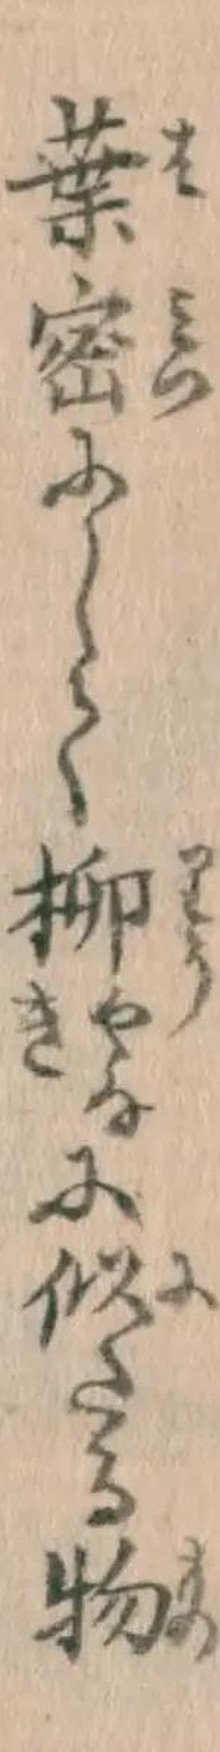葉密にして柳やなきに似たる物
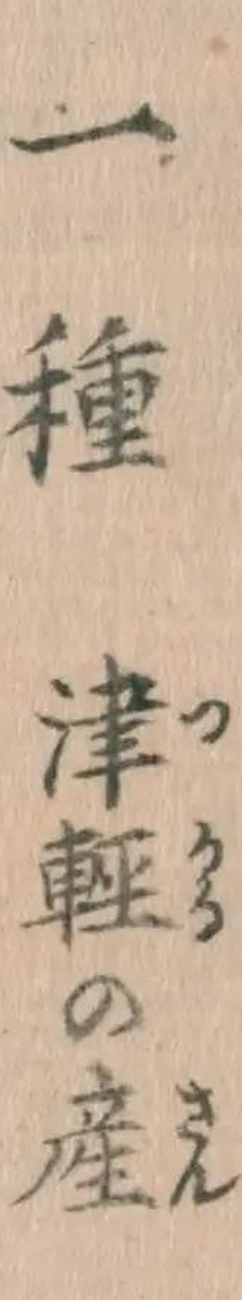一種津軽の産
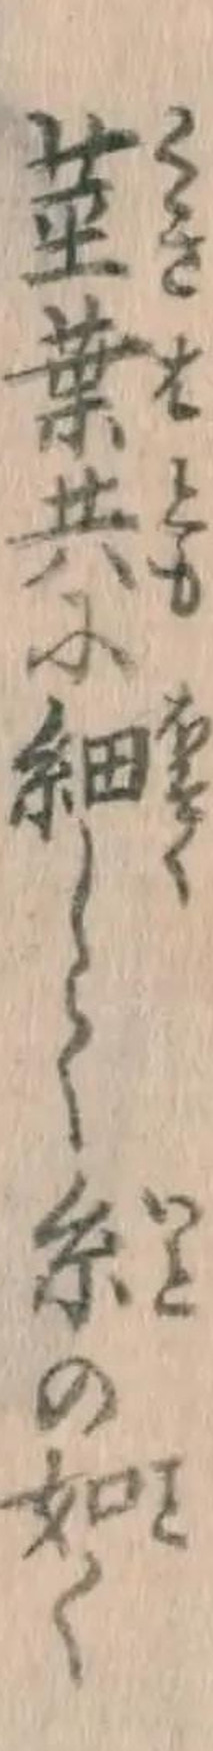茎葉共に細して糸の如く

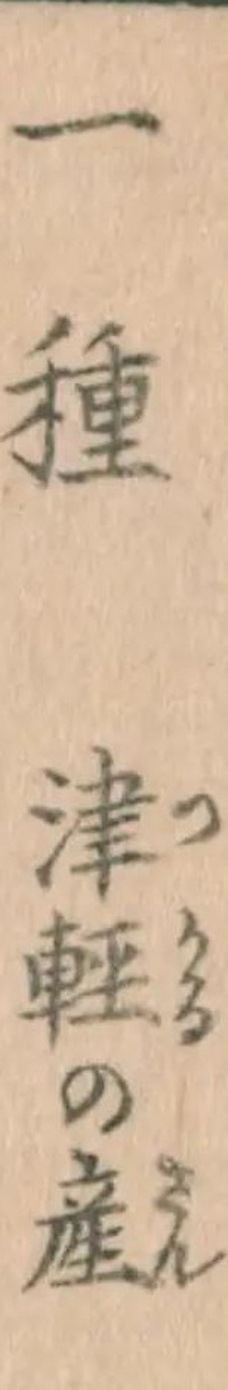一種津軽の産
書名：本草図譜. 巻34-36
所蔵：国立国会図書館 National Diet Library, JAPAN
